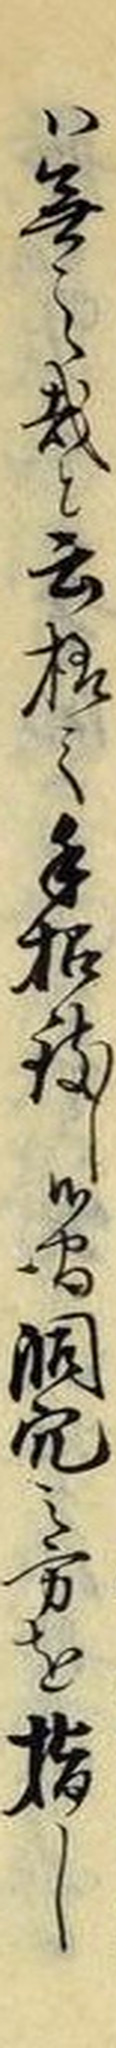ハ無之哉と云様之手招致し候間洞穴之方を指し
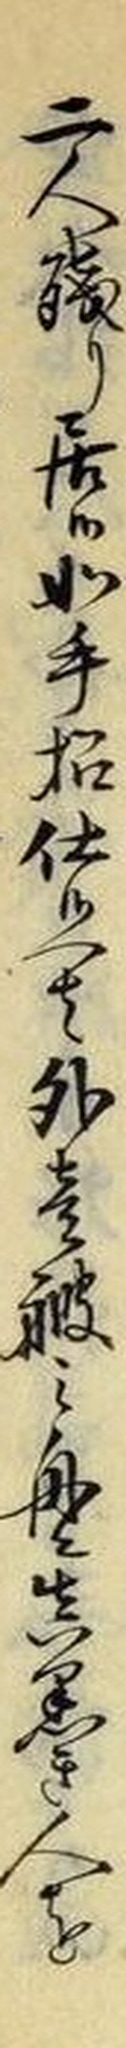二人残り居候如手招仕候へ者外壱艘之舟ニ真黒き人を
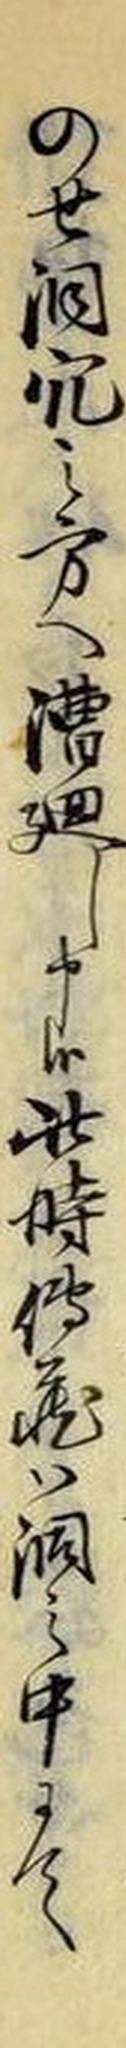のせ洞穴之方へ漕廻し申候此時傳蔵ハ洞之中にて
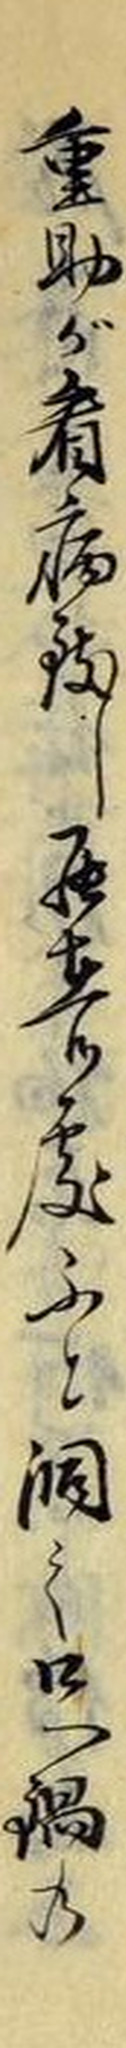重助が看病致し罷在候處ふと洞之口へ鍋の

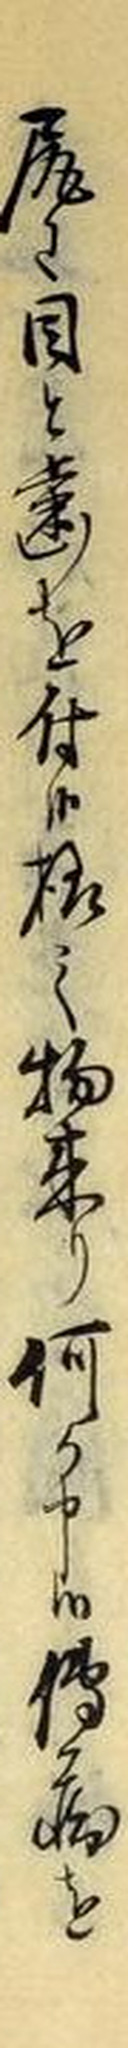尻に目と歯を付候様之物来り何か申候伝蔵を
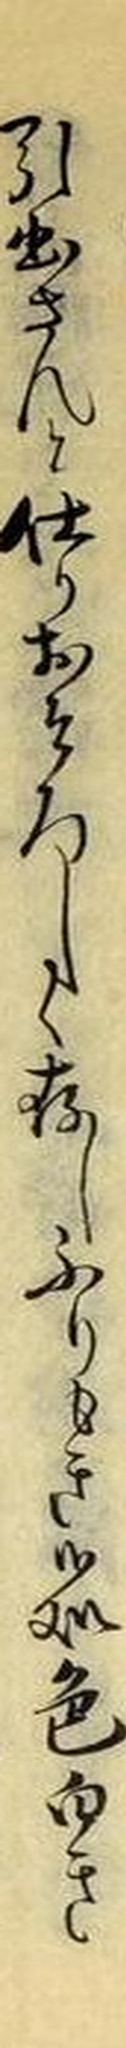引出さんと仕りおそろしく存しふりもき候処色白き
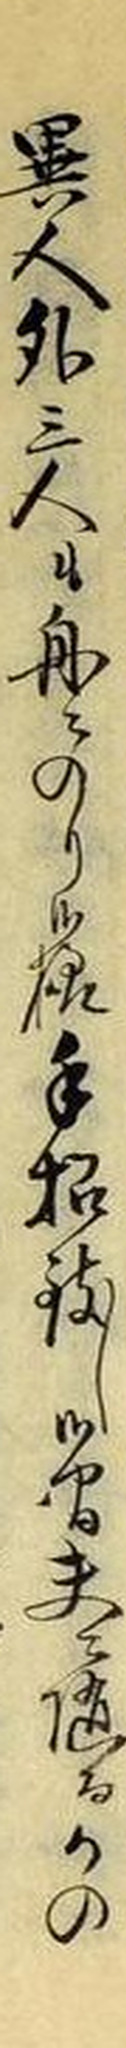異人外三人も舟ニのり候様手招致し候間夫ニ随而かの
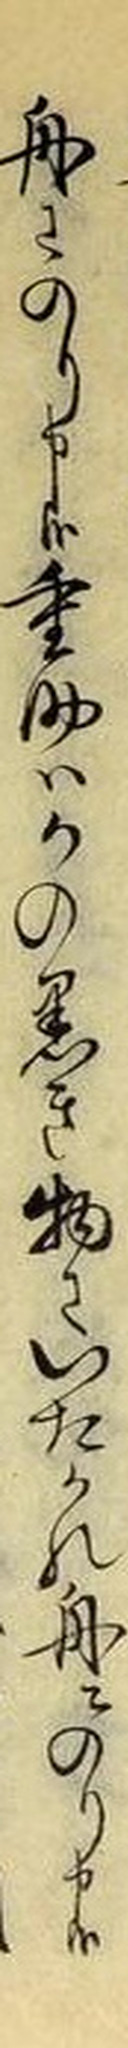舟にのり申候重助ハかの黒き物にいたかれ舟ニのり申候、
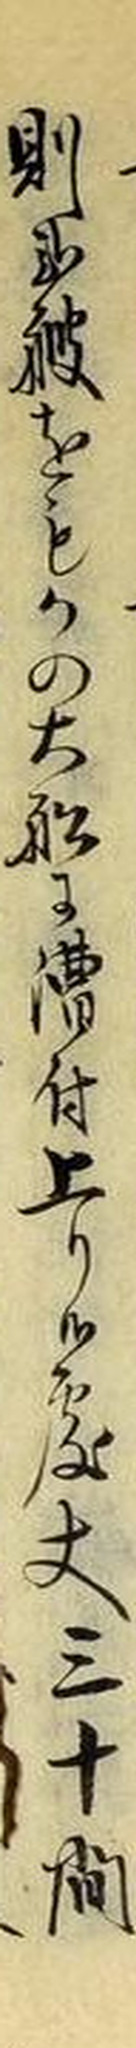則弐艘をもかの大船に漕付上り候処丈三十間
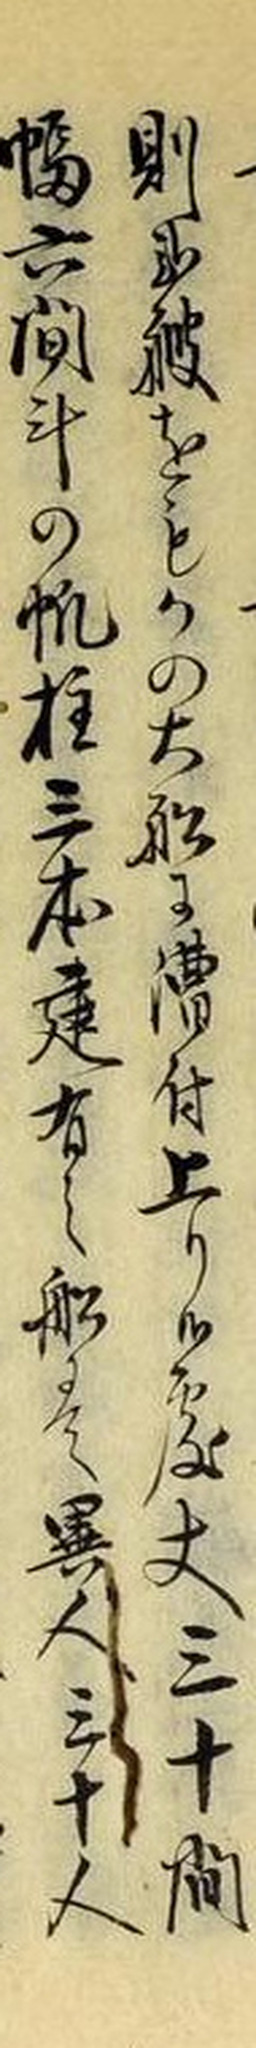幅六間斗の帆柱三本建有之船にて異人三十人
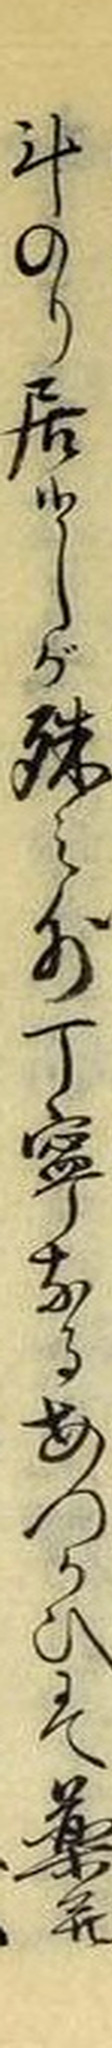斗のり居候しが殊之外丁寧なるあつかいにて薬幷
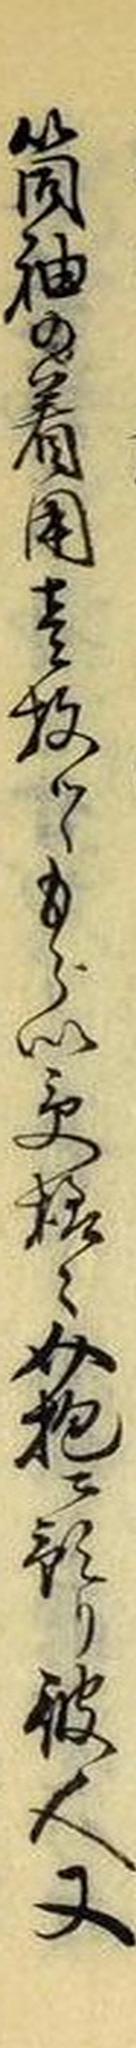筒袖の着用壱枚ツヽもらい受様々介抱ニ預り彼人又
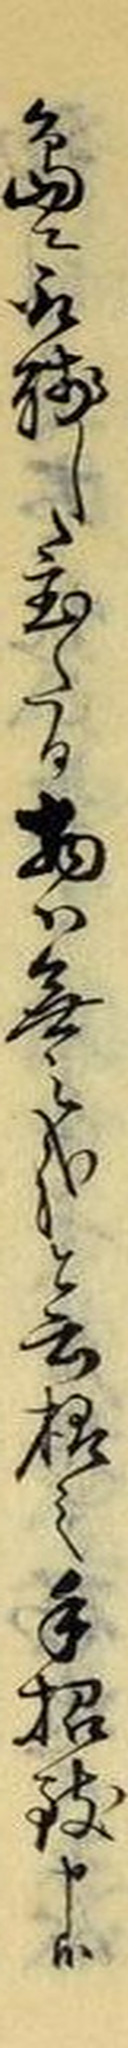島ニ取残し置たる物ハ無之哉と云様之手招致申候
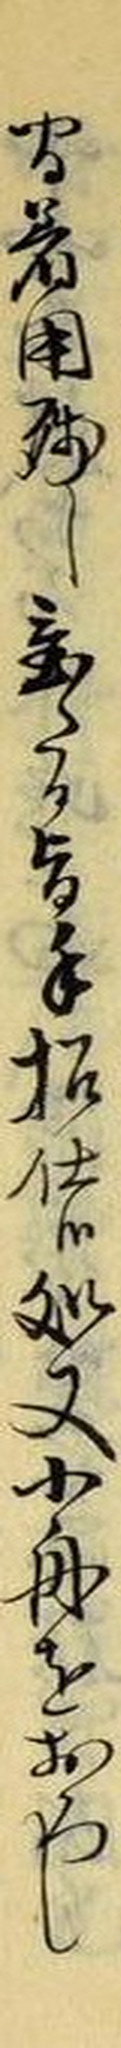間着用残し置たる旨手招仕候処又小舟をおろし
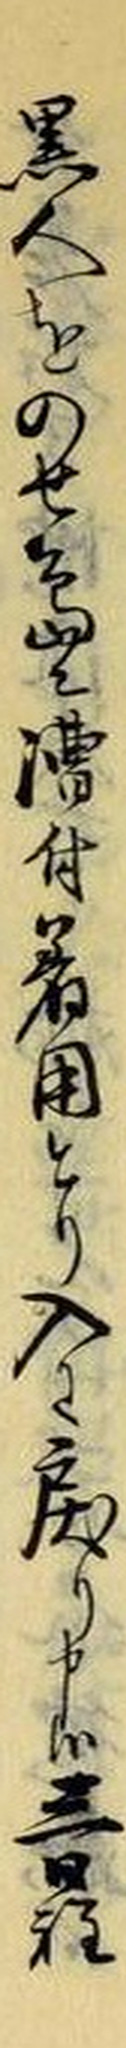黒人をのせ島ニ漕付着用とり入に戻り申候三日程
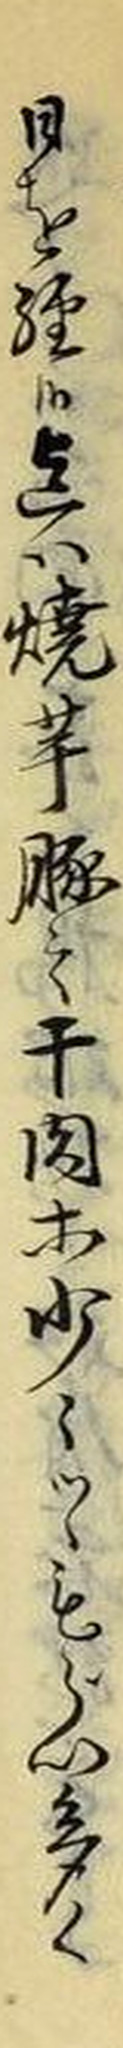日ヲ経候迄ハ焼芋豚之干肉等少々ツヽもらい多く
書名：漂客談奇（備考雑録写8）
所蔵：福井県文書館 Fukui Prefectural Archives
